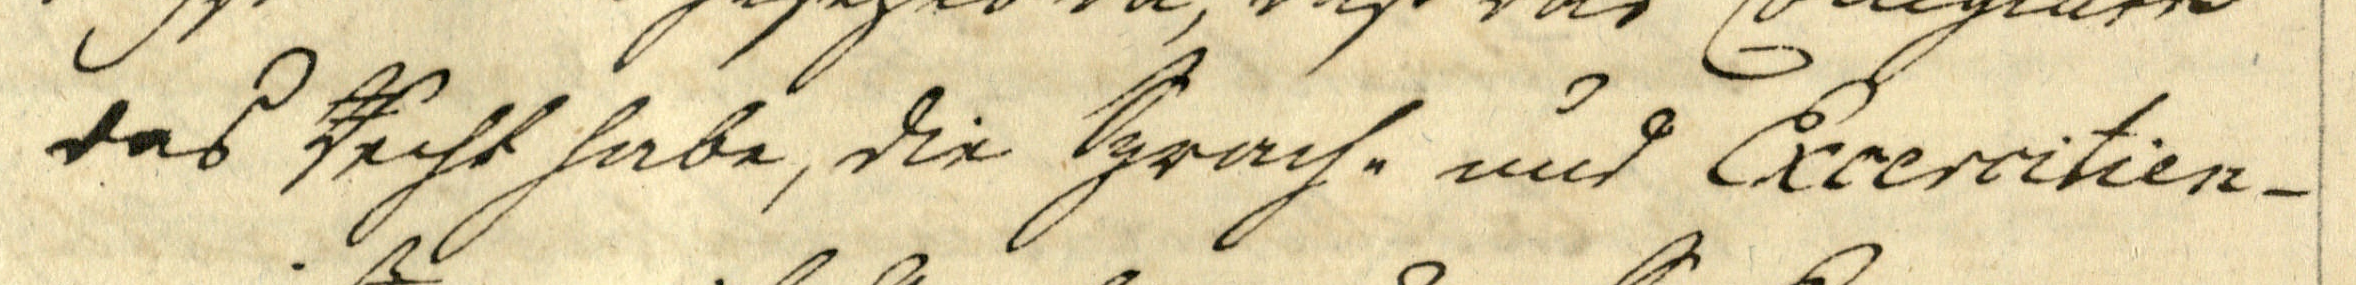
das Recht habe, die Sprach- und Excercitien¬
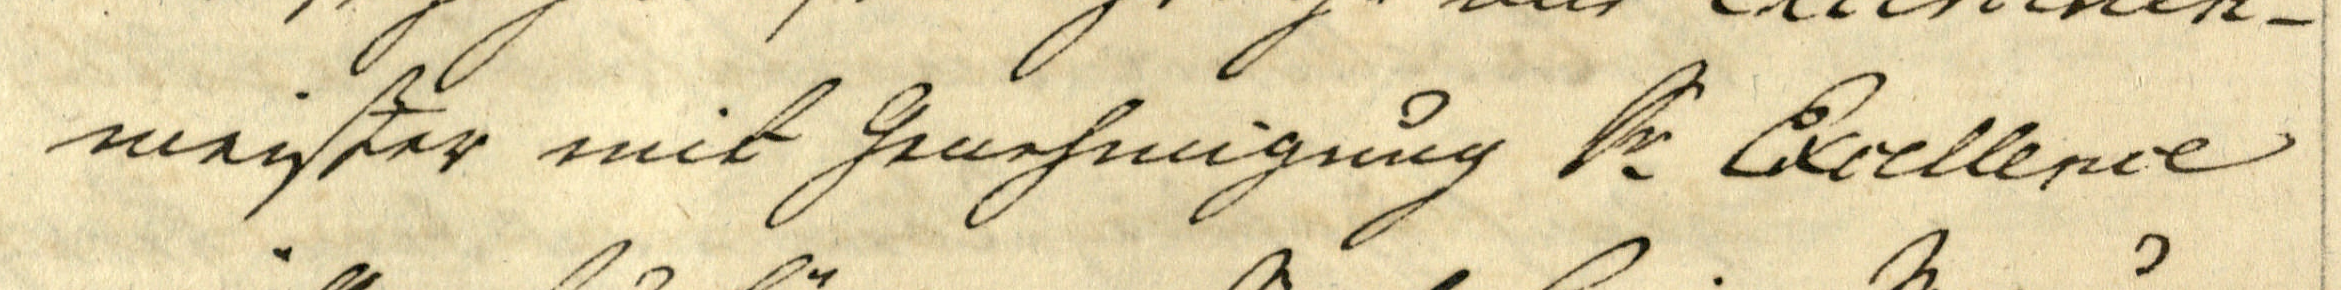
meister mit Genehmigung Sr Excellence
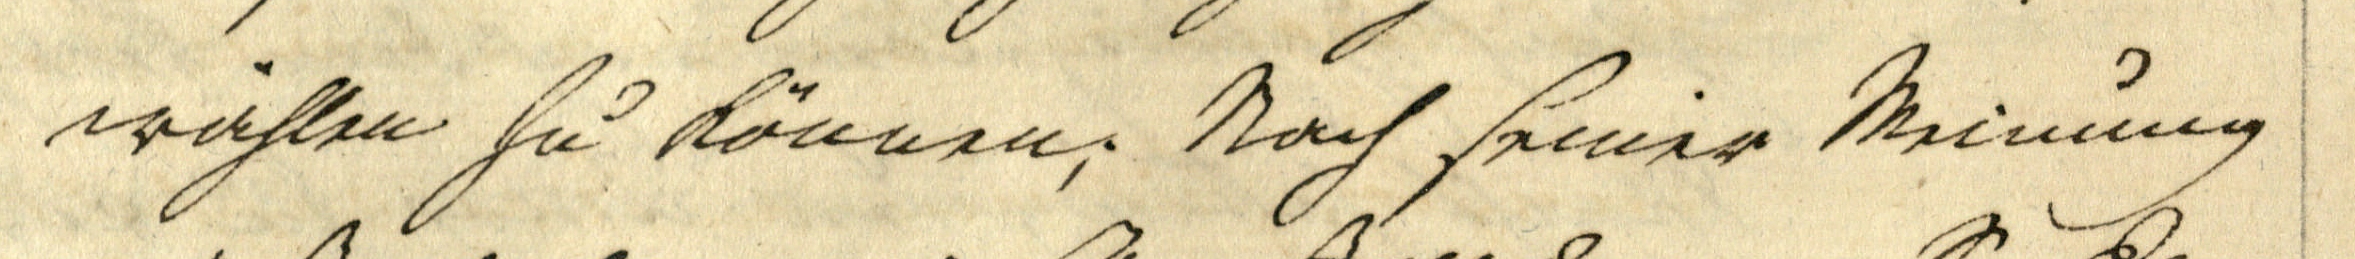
wählen zu können; Nach seiner Meinung
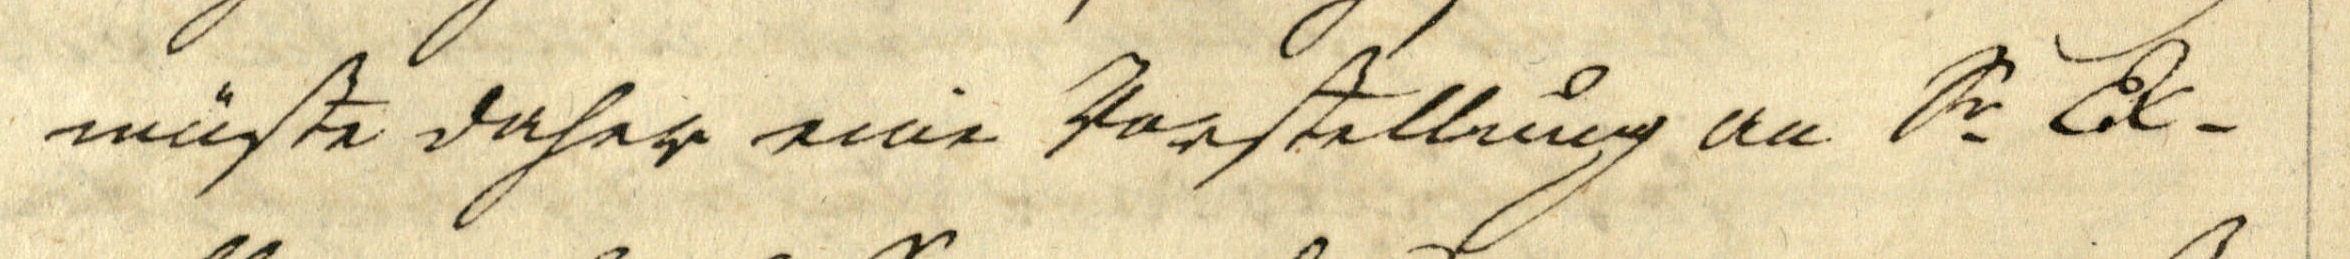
müßte daher eine Vorstellung an Sr. Ex¬
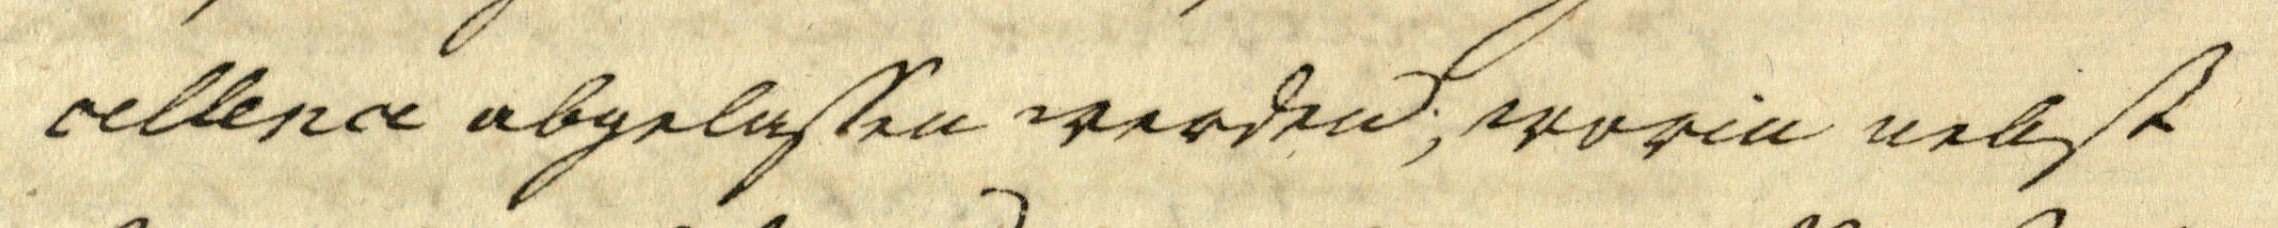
cellence abgelassen werden, worin nebst
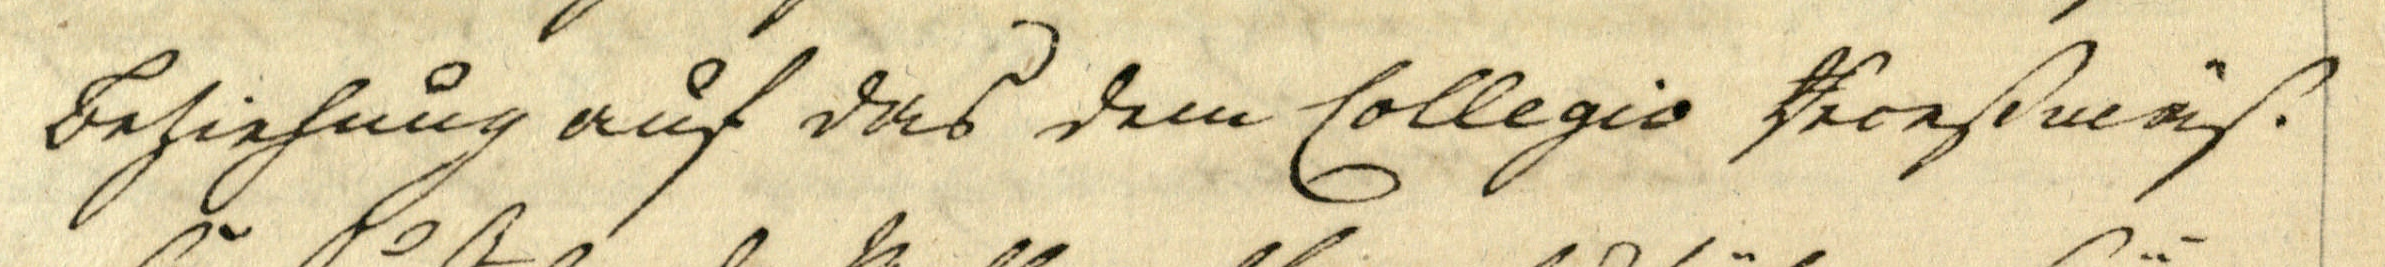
Beziehung auf das dem Collegio Receßmäs¬
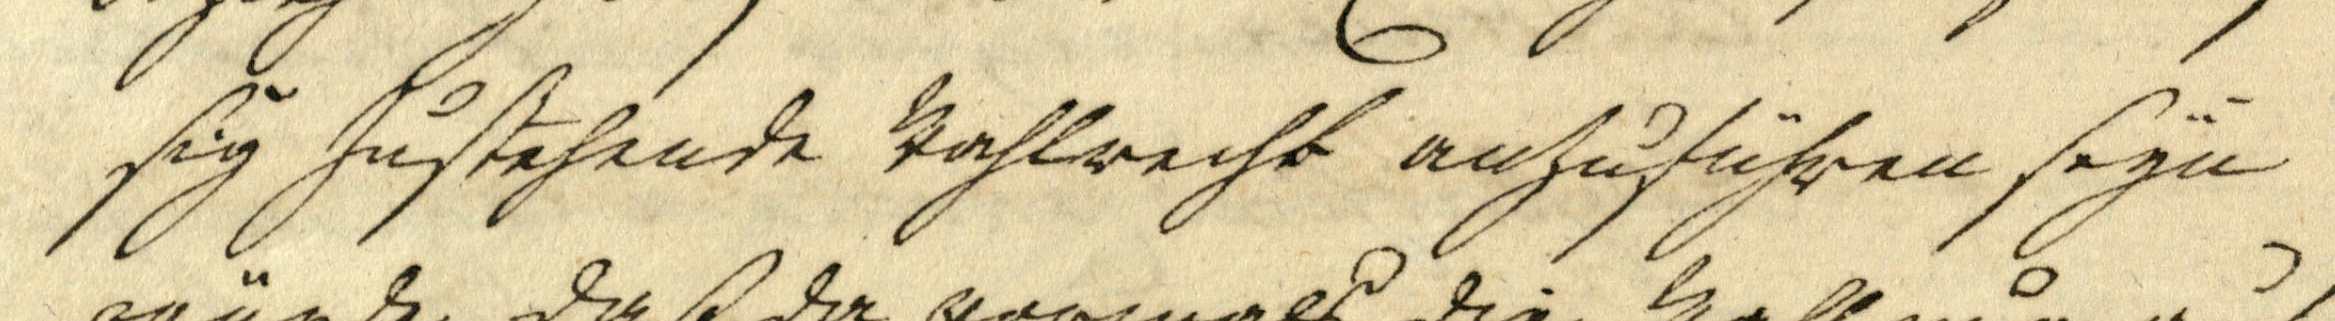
sig zustehende Wahlrecht anzuführen seÿn
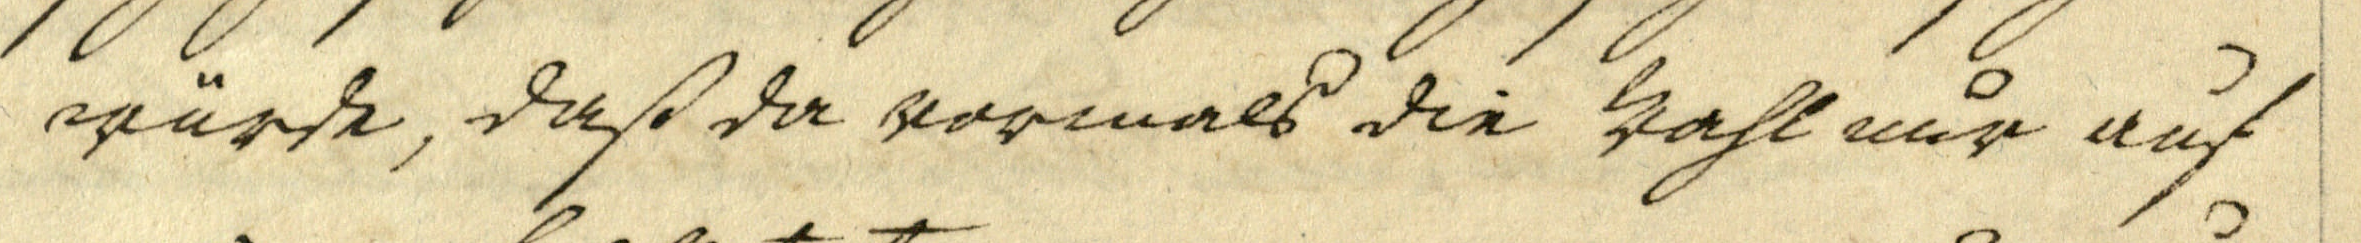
würde, daß da vormals die Wahl nur auf
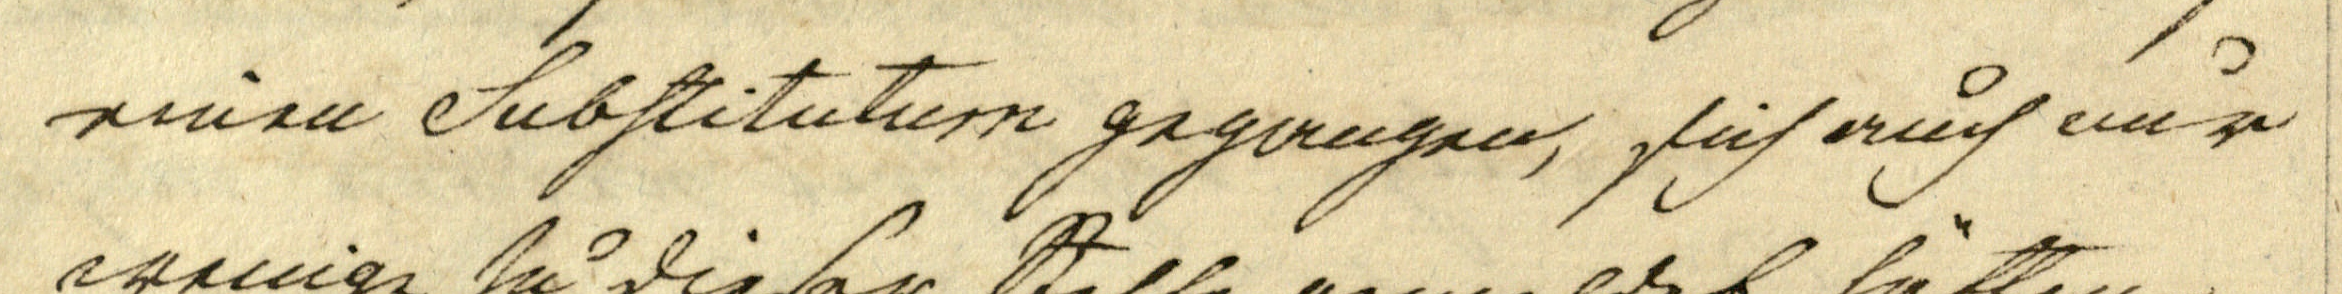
einen Substitutum gegangen, sich auch nur
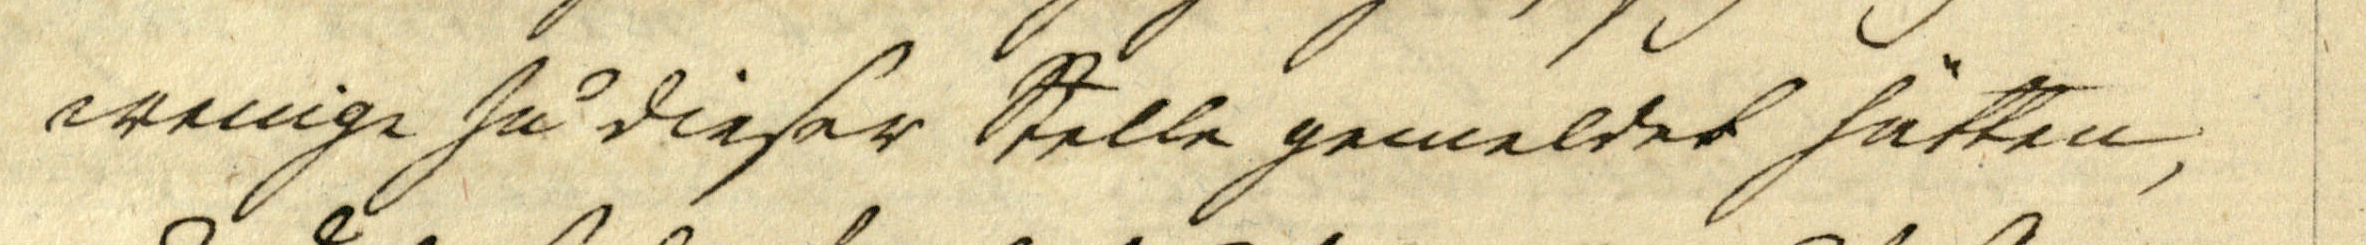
wenige zu dieser Stelle gemeldet hätten,
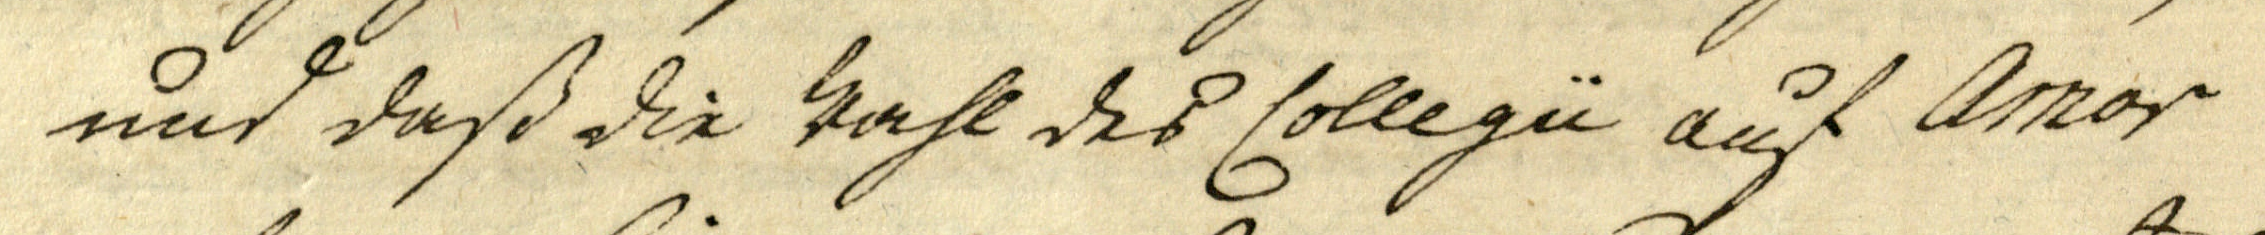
und daß die Wahl des Collegii auf Amor
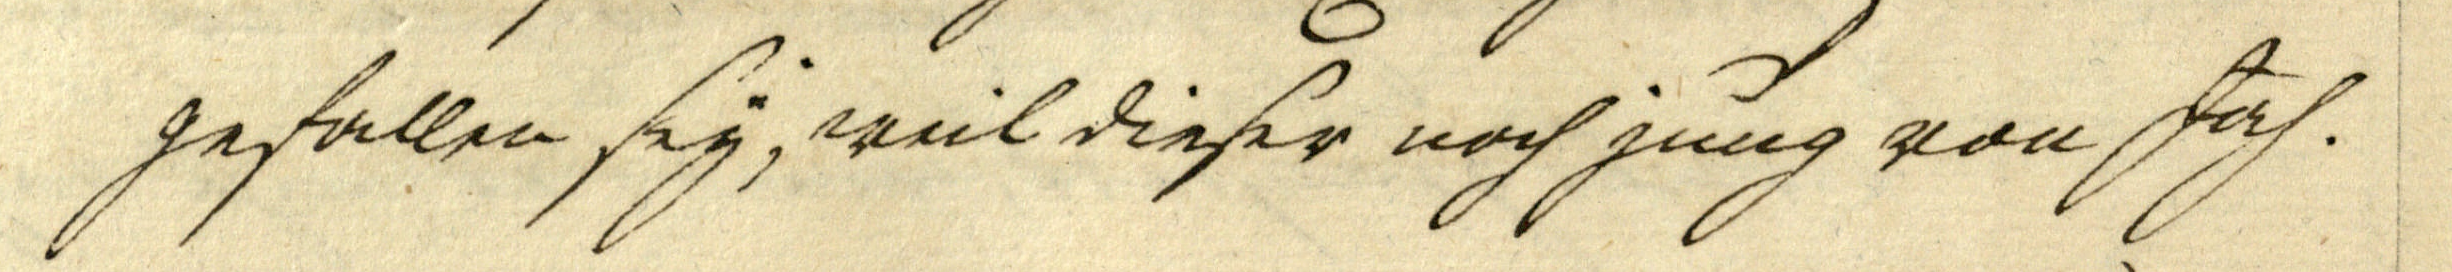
gefallen seÿ, weil dieser noch jung von Jah¬
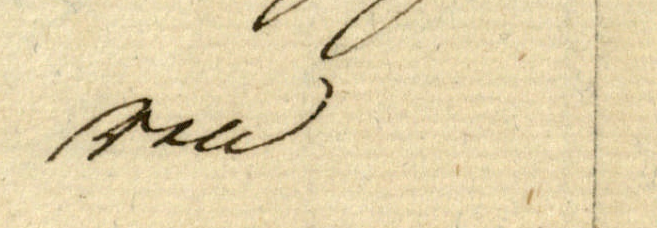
ren
